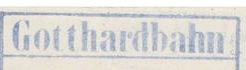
Direction du Gothard.
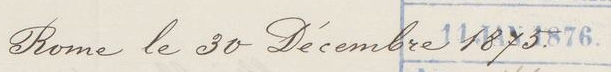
Rome le 30 Décembre 1875.
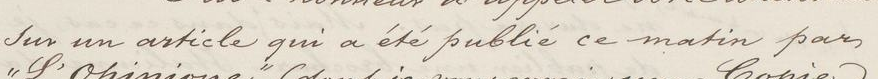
sur un article qui a été publié ce matin par
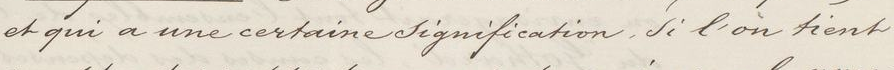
et qui a une certaine signification, si l'on tient
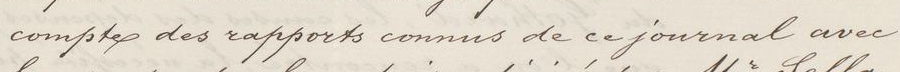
compte des rapports connus de ce journal avec
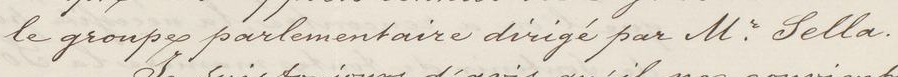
le groupe parlementaire dirigé par MrSella.
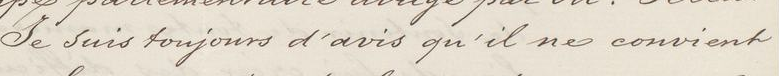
Je suis toujours d'avis qu'il ne convient
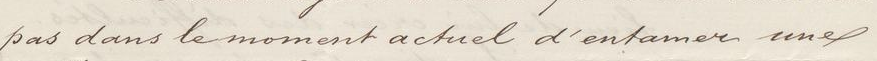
pas dans le mement actuel d'entamer une
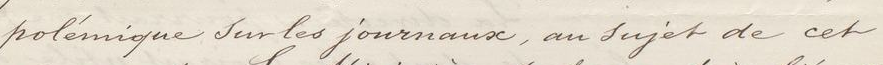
polémique sur les journaux, au sujet de cet
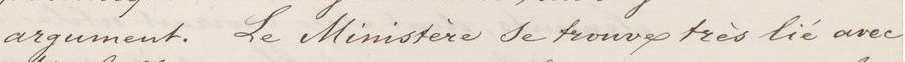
argument. Le Ministère se trouve très lié avec
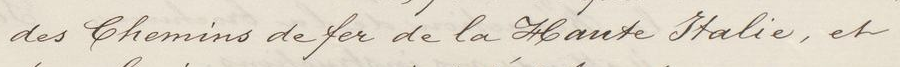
des Chemins de fer de la Haute Italie, et
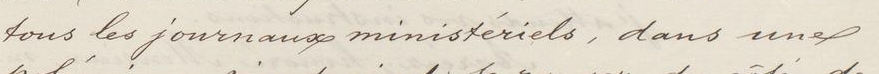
tous les journax ministériels, dans une
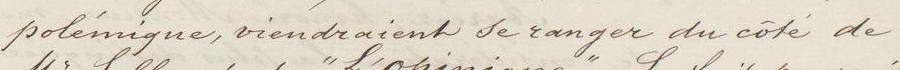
polémique, viendraient se ranger du côté de
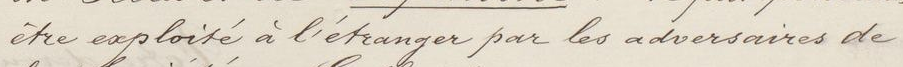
être exploité à l'étranger par les adversaires de
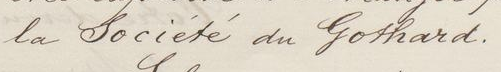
la Société du Gothard.
